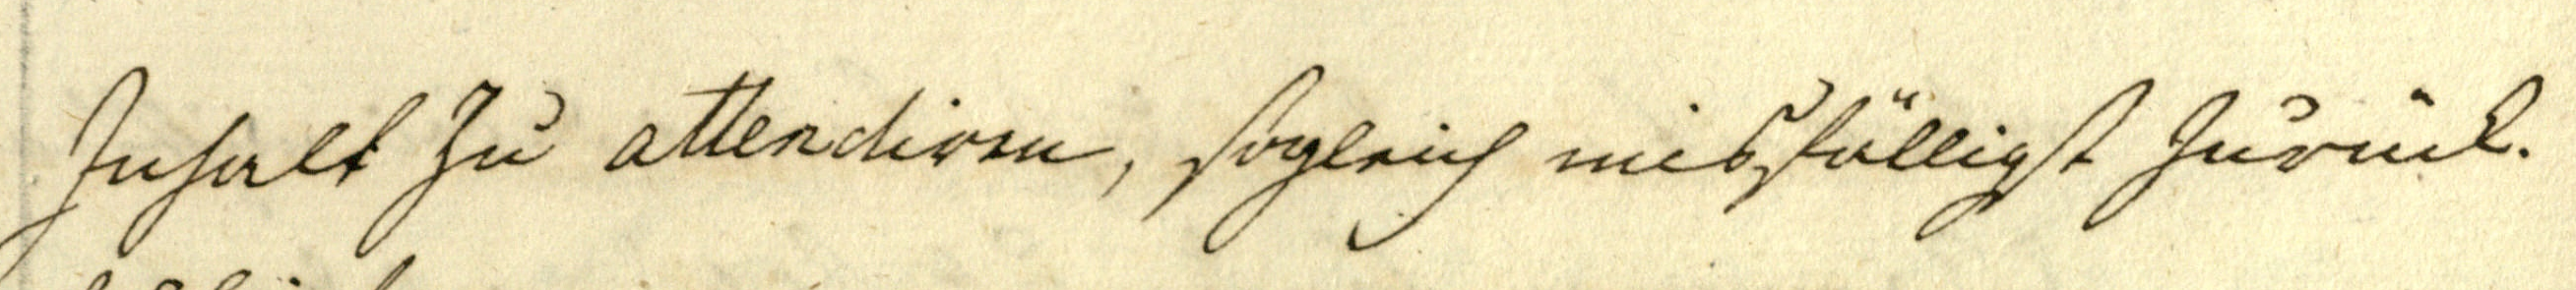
Inhalt zu attendiren, sogleich misfälligst zurück¬
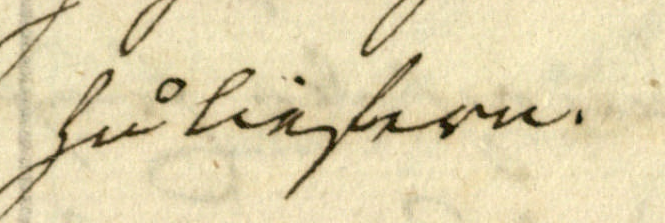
zu liefern.
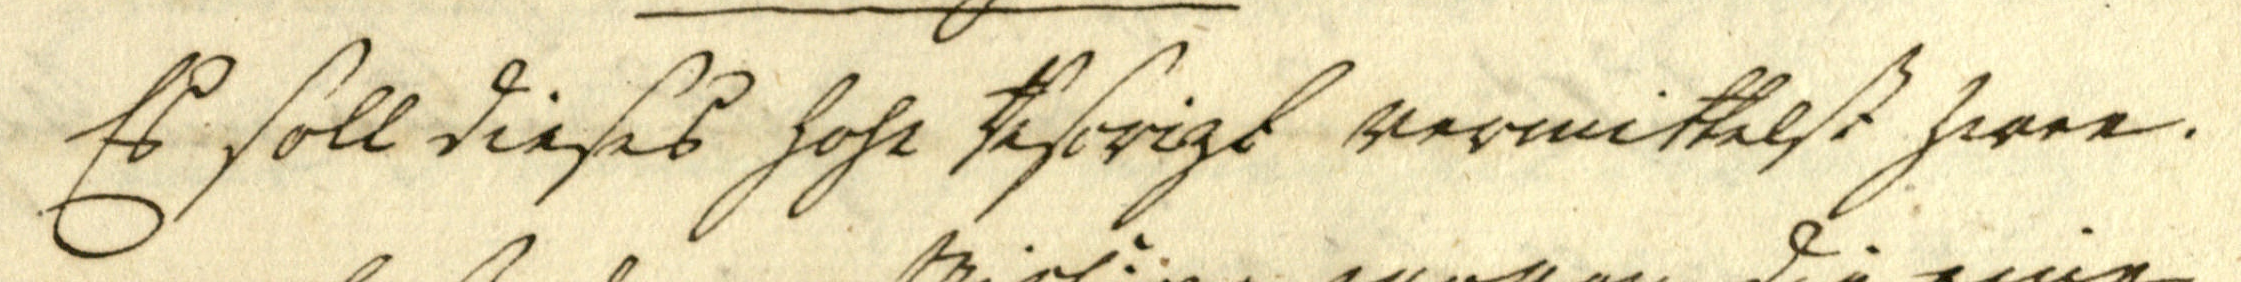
Es soll dieses hohe Rescript vermittelst zwee¬
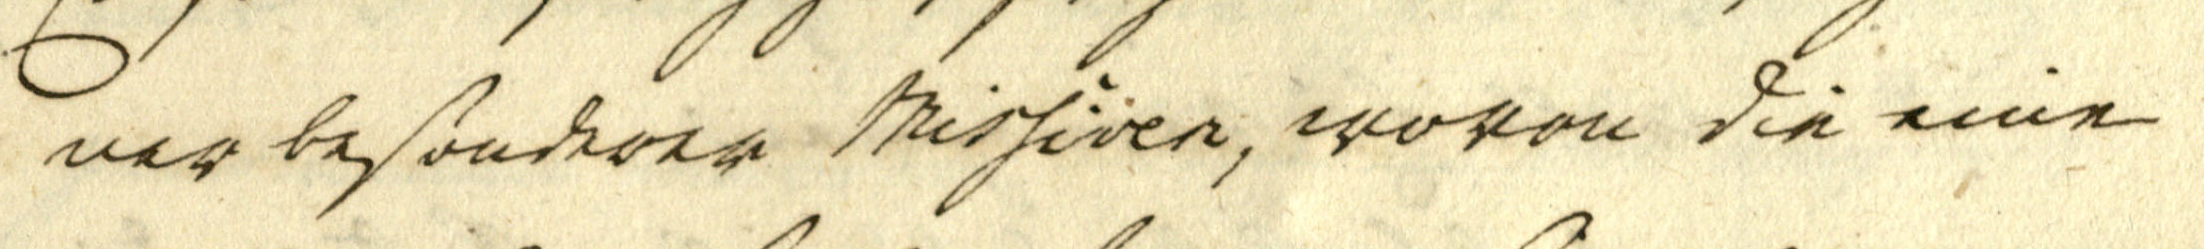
ner besonderer Missiven, wovon die eine
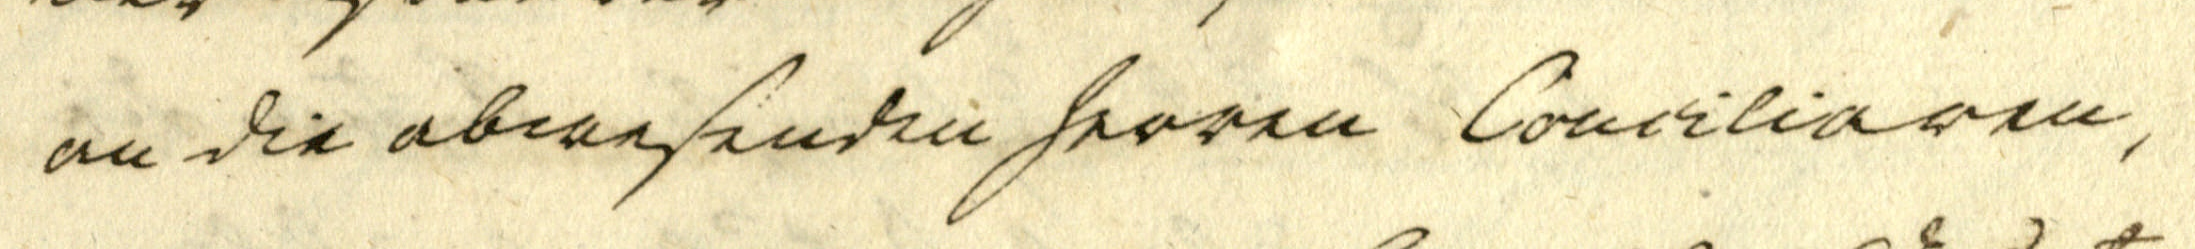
an die abwesenden Herren Conciliaren,
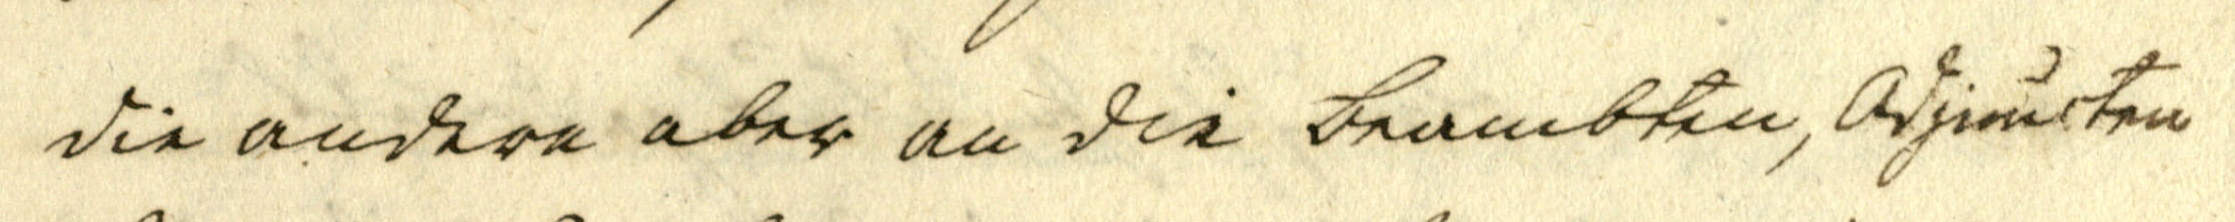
die andere aber an die Beambten, Adjuncten
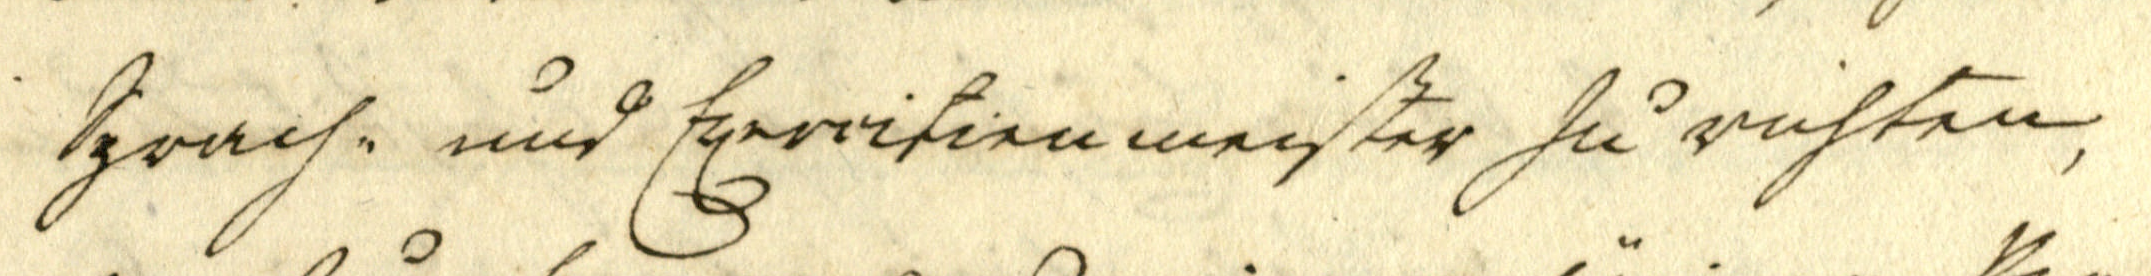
Sprach- und Exercitienmeister zu richten,
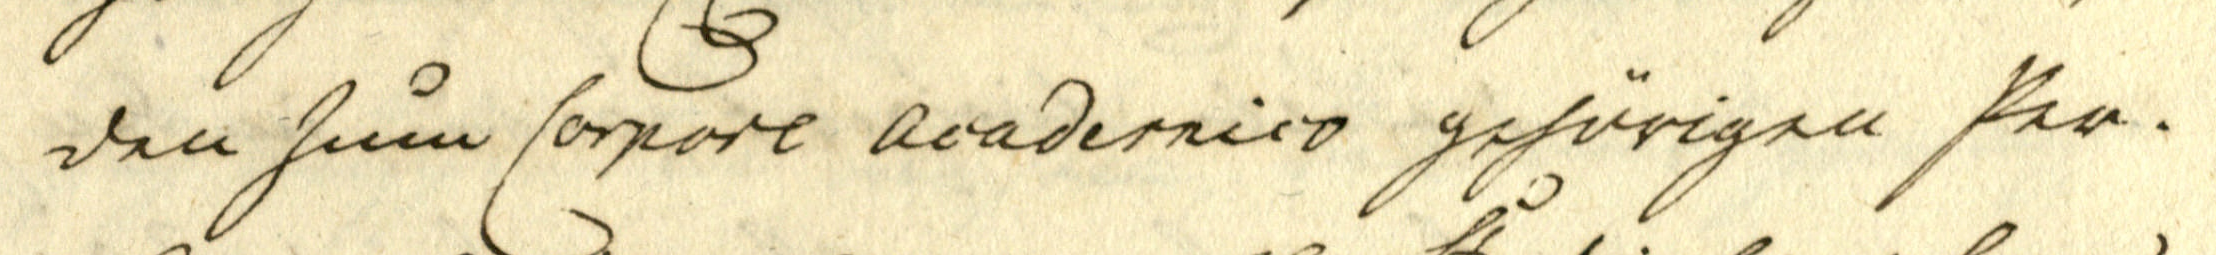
den zum Corpore Academico gehörigen Per¬
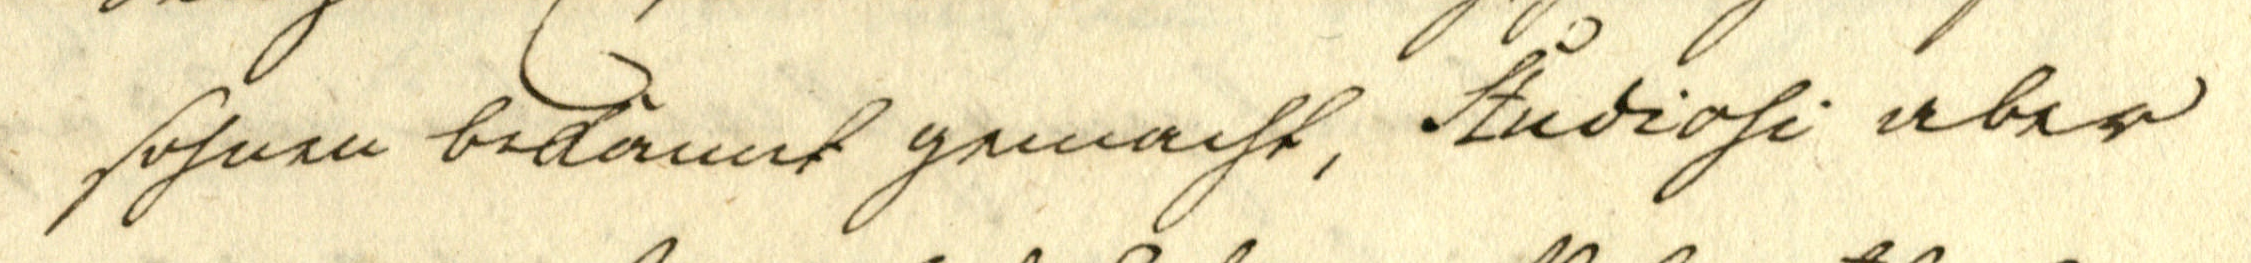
sohnen bekannt gemacht, Studiosi aber
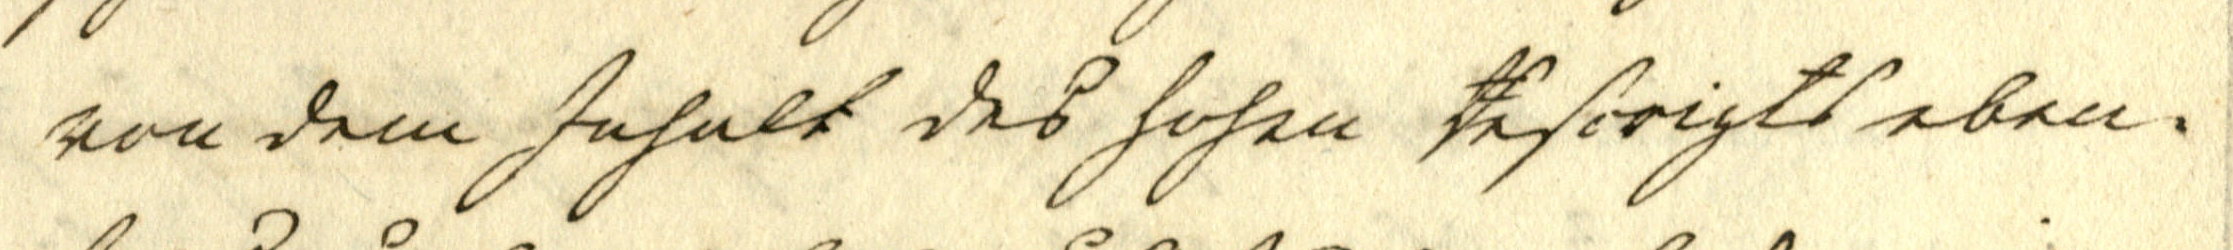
von dem Jnhalt des hohen Rescripts eben¬
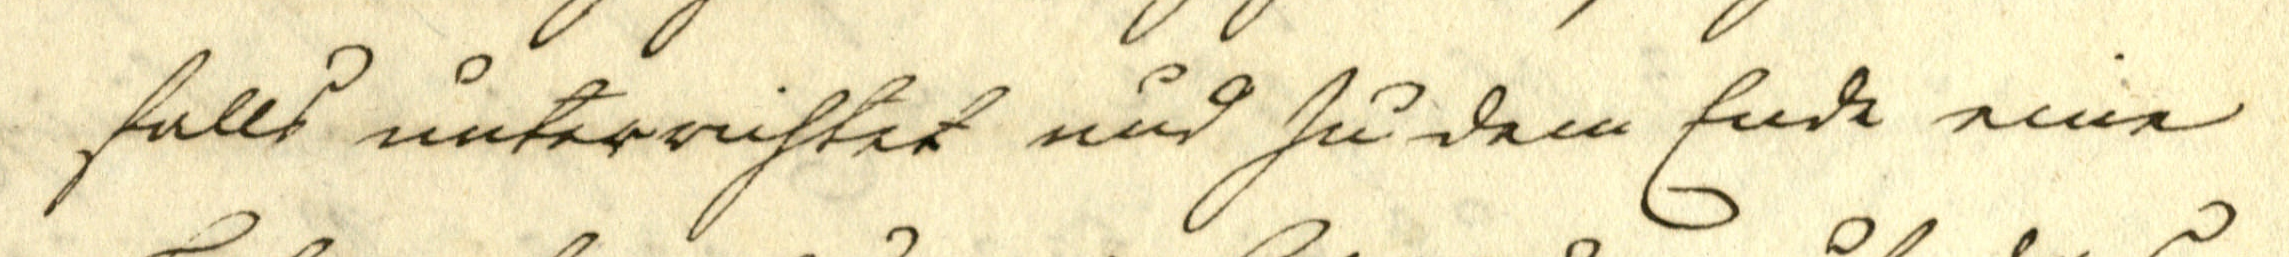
falls unterrichtet und zu dem Ende eine
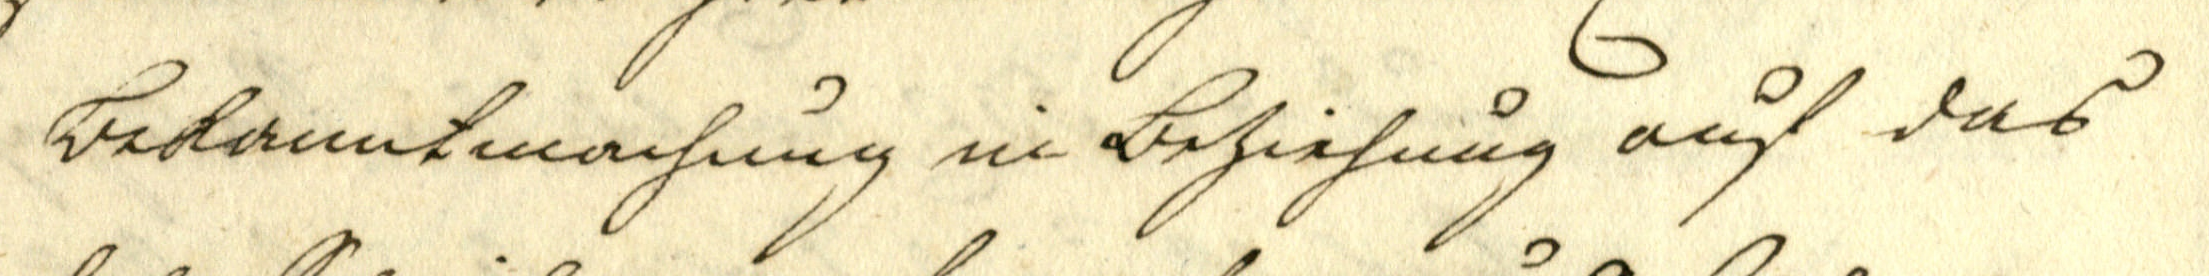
Bekanntmachung in Beziehung auf das
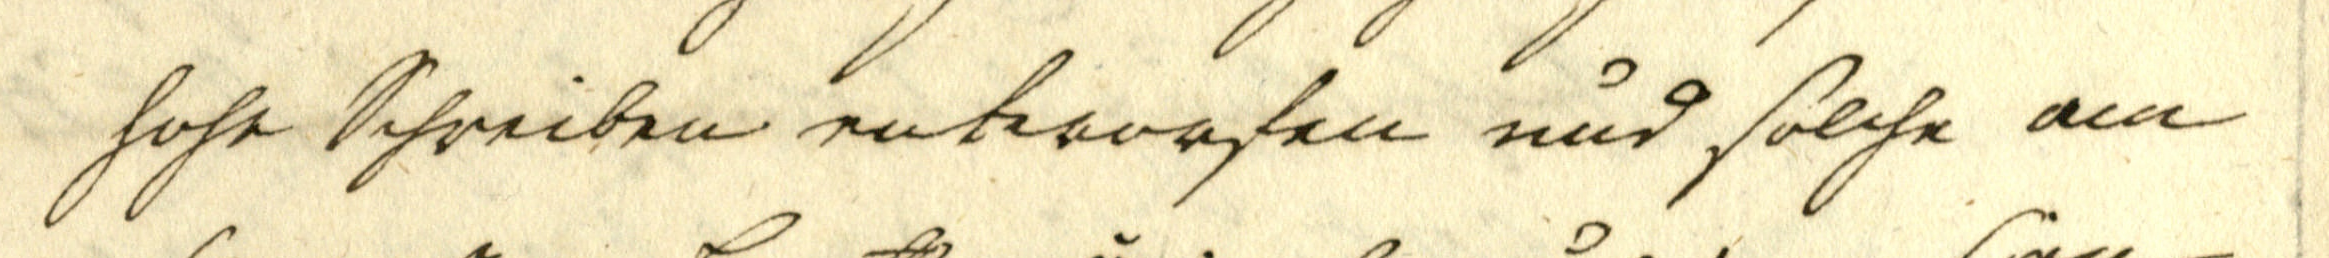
hohe Schreiben entworfen und solche am
